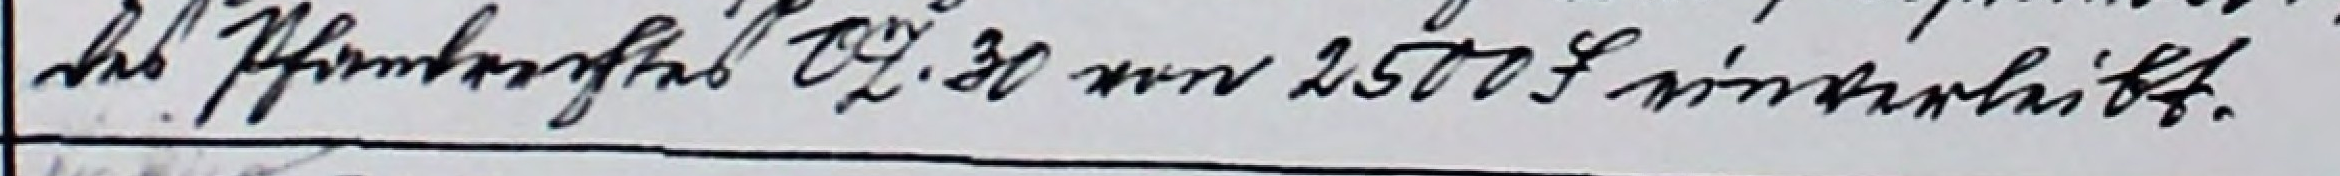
des Pfandrechtes OZ. 30 von 2500 F einverlebt.
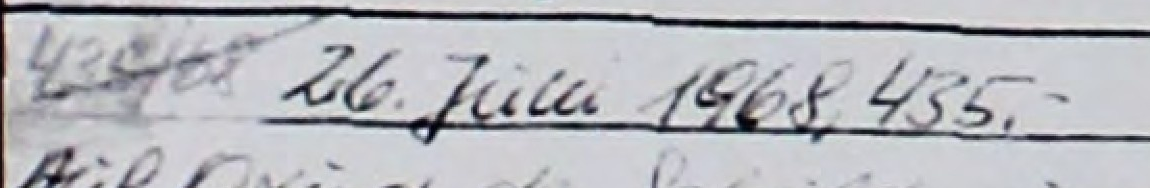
435/68 26. Juni 1968, 435.-
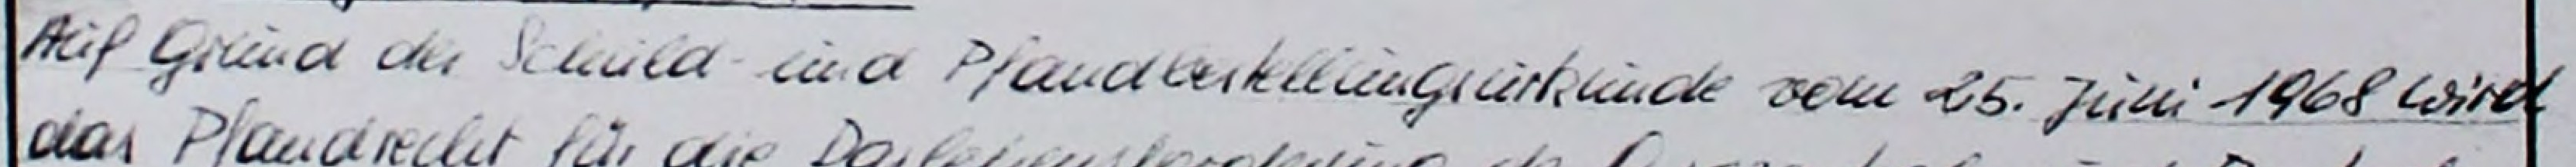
Auf Grund der Schuld- und Pfanderstellungsurkunde vom 25. Juni 1968 wird
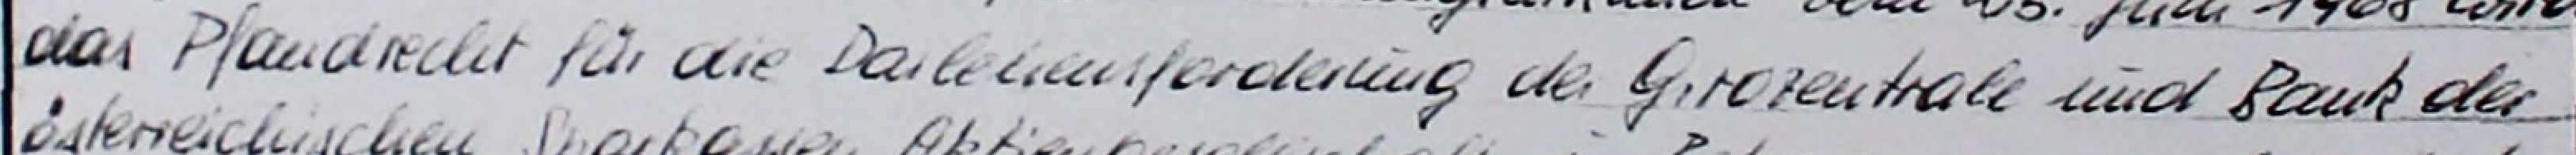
das Pfandrecht für die Darlehensforderung der Girozentrale und Bank der
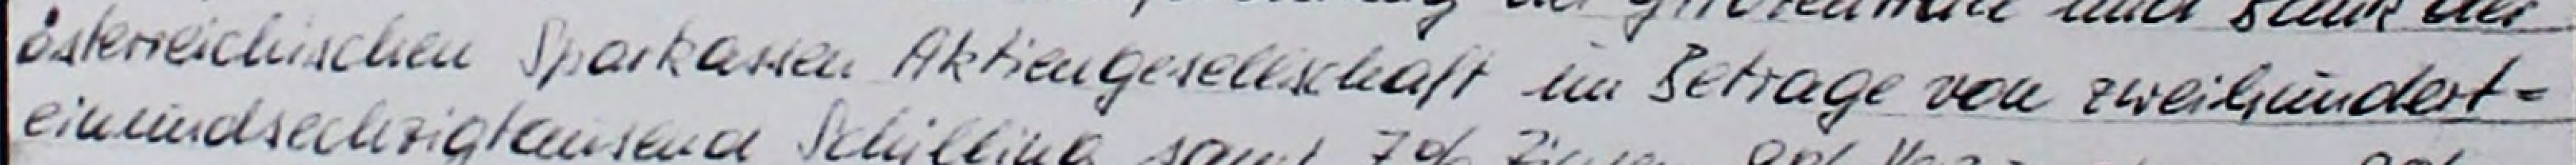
österreichischen Sparkassen Aktiengesellschaft im Betrage von zweihundert=
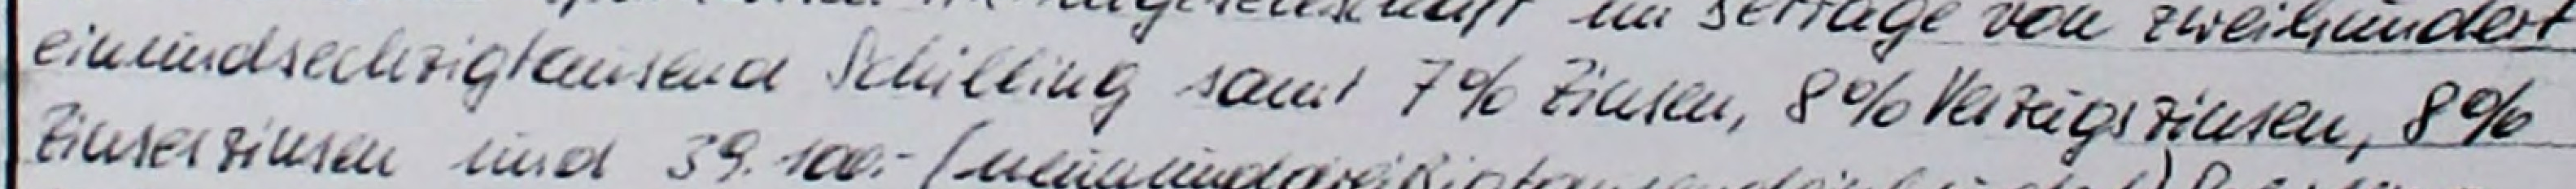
einundsechzigtausend Schilling samt 7 % Zinsen, 8 % Verzugszinsen, 8 %
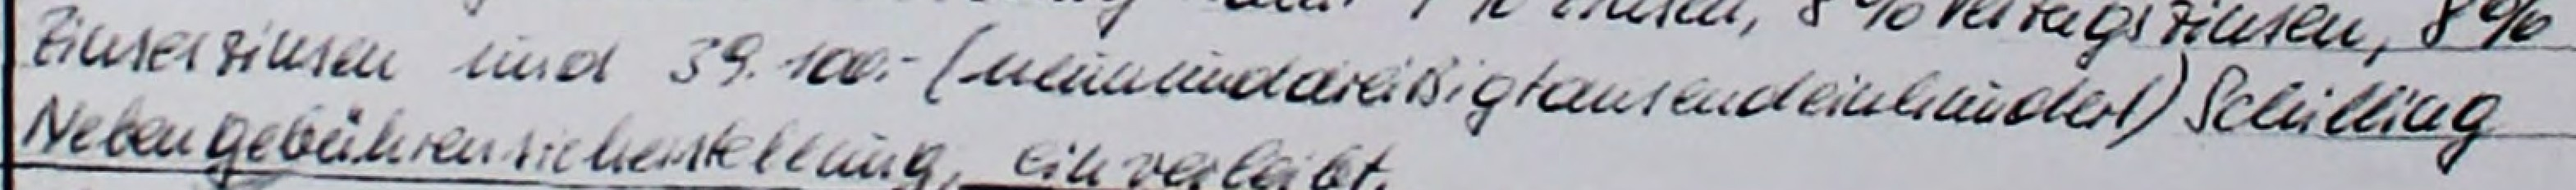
Zinserzisen und 39. 100.- (neununddreißigtausendeinhundert) Schilling
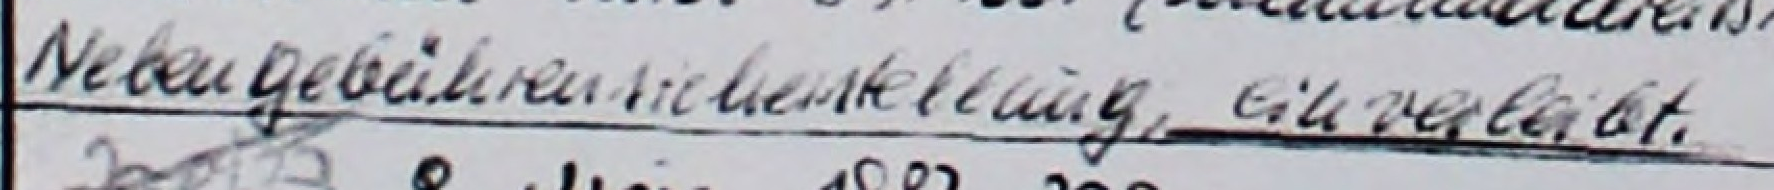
Nebengebührensicherstellung, einverleibt.
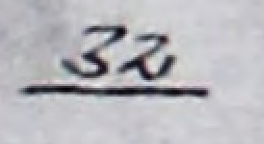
32
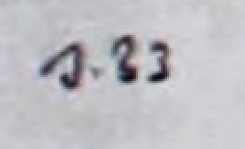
s. 33
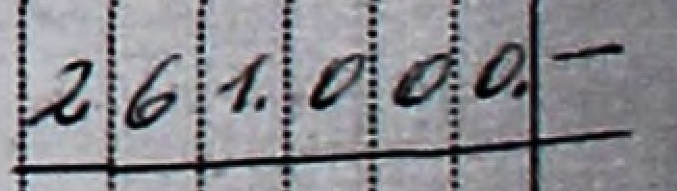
261.000.-
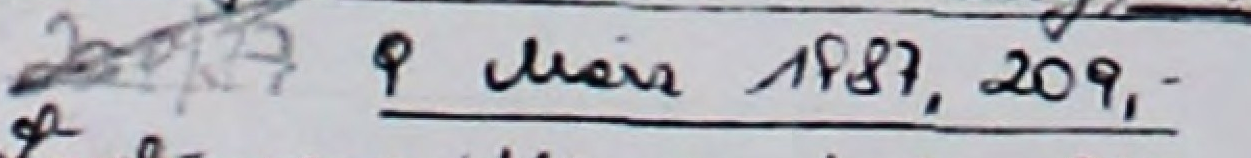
209/87 9 Mais 1987, 209,-
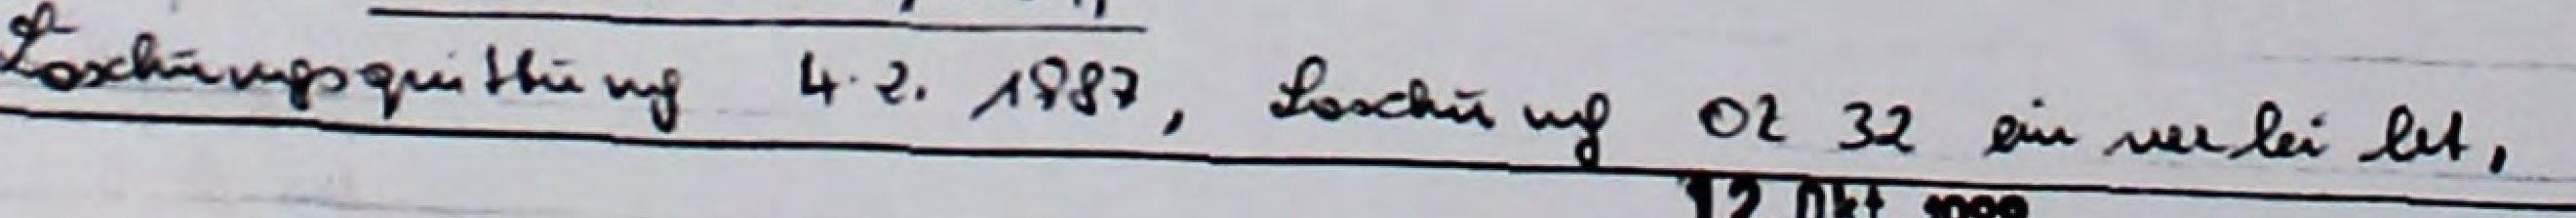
Löschungsquittung 4. 2. 1987, Löschung 02 32 einverleibt.
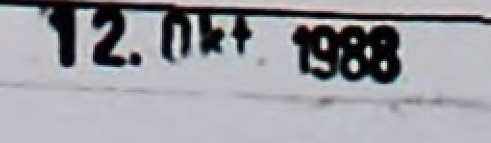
12. Okt. 1988
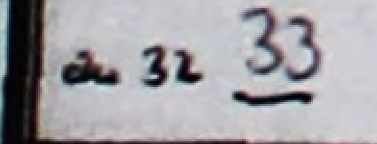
zu 32 33
